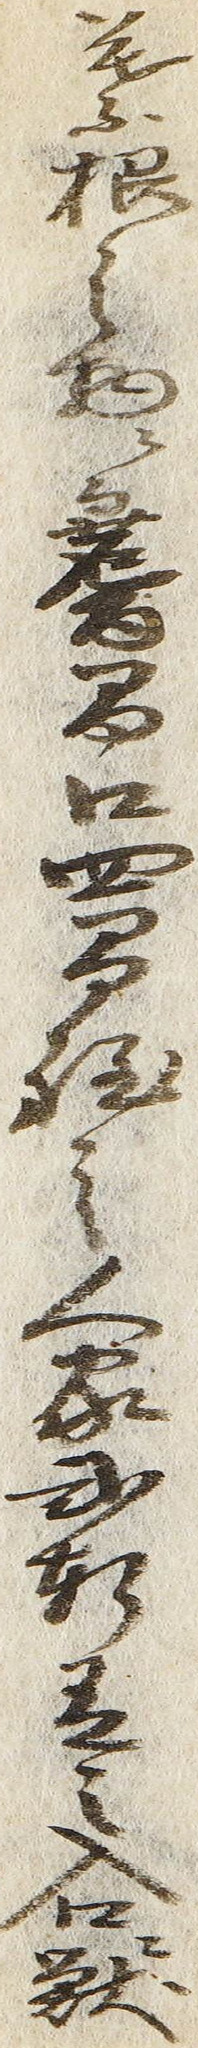葉根之物ニ而葺間口四間程之人家弐軒有之入口ニ獣
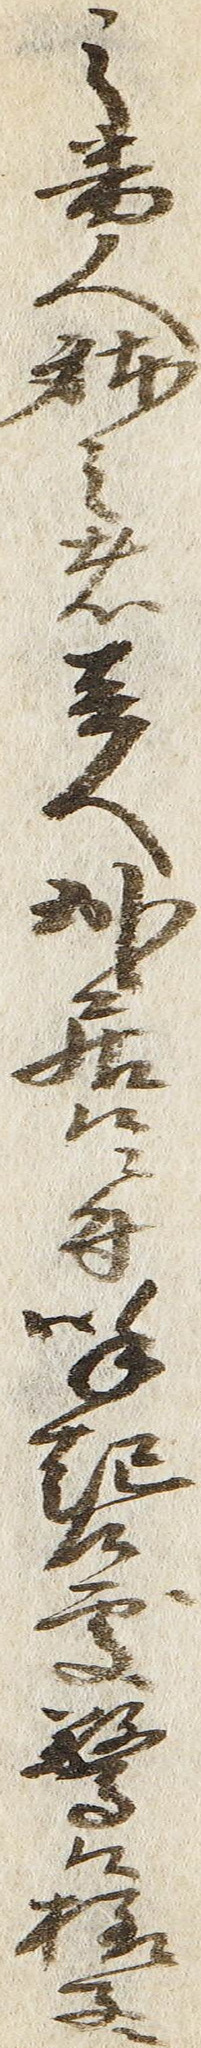之番人躰之者壹人臥居候ニ付呼起候處驚候様子
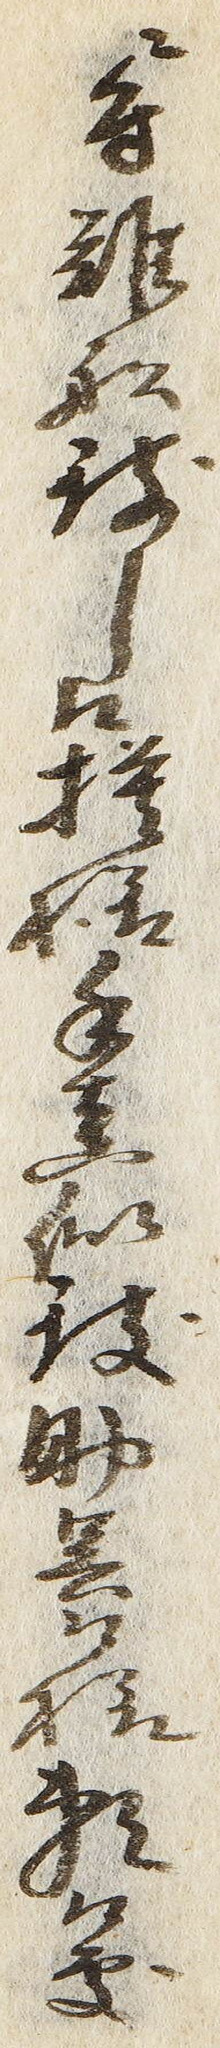ニ付難舩致し候模様手真似致助呉候様頼候處
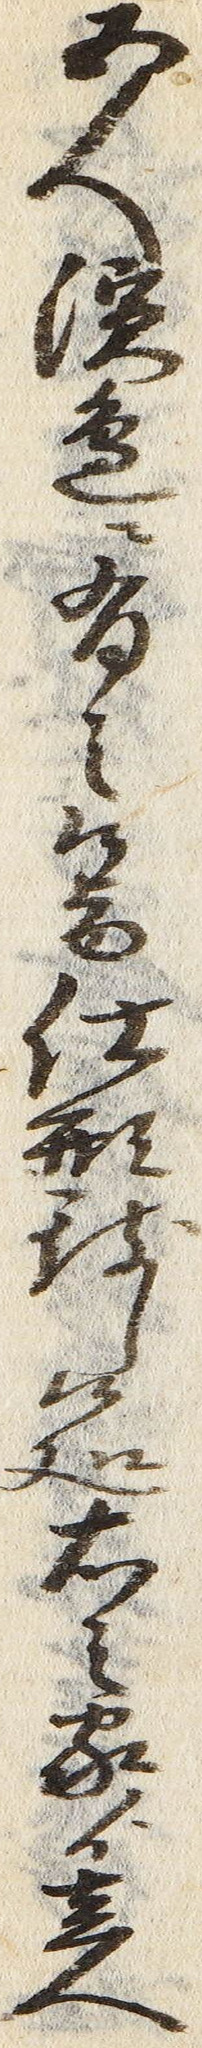五人濱邊ニ有之候旨仕形致し候処右之家ゟ壹人
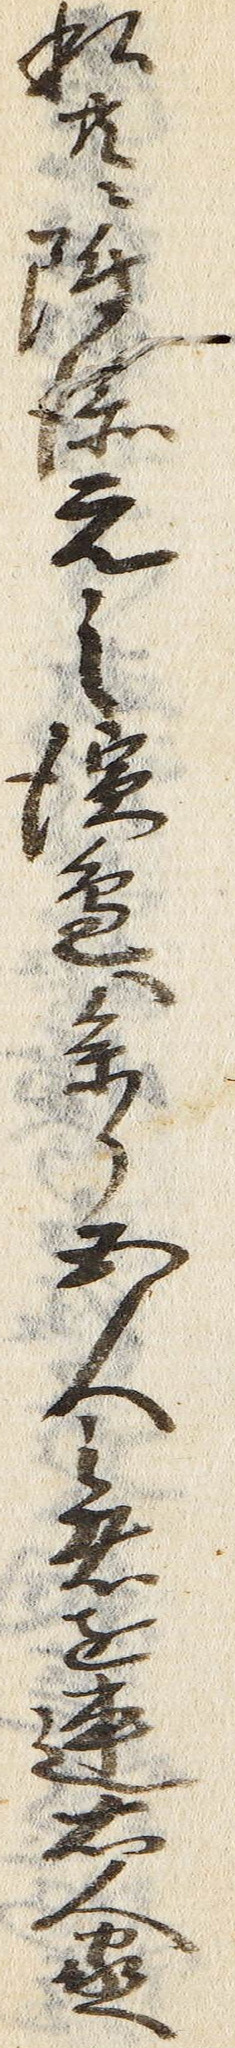私共ニ附添元之濱邊へ参り五人之者を連右人家へ
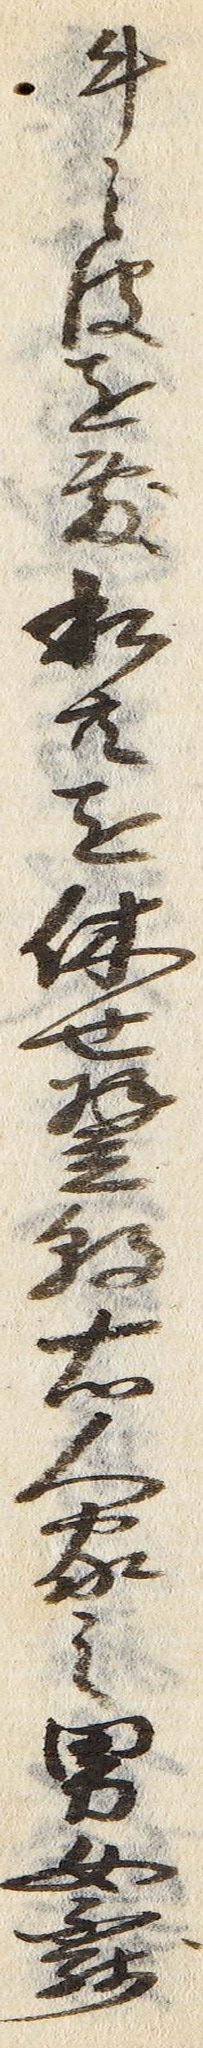牛之皮を敷私共を休せ翌朝右人家之男女不残
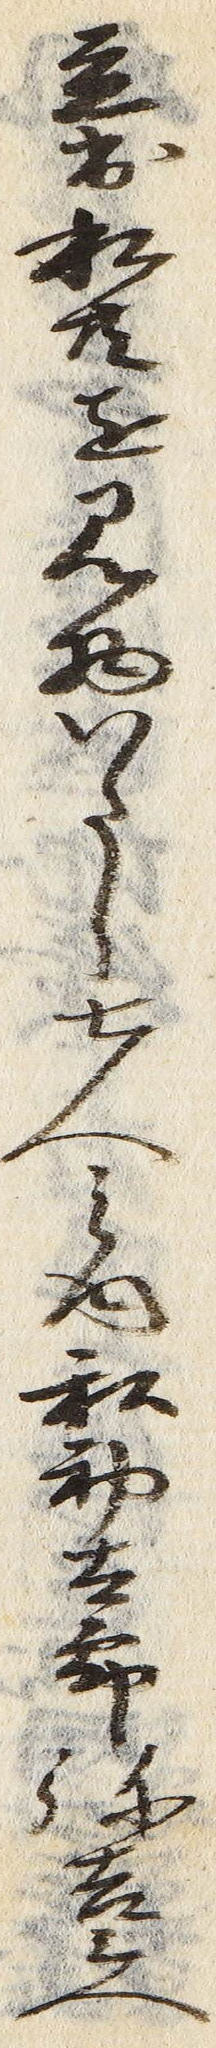立出私共を見物いたし七人之内私初太郎弥吉三人
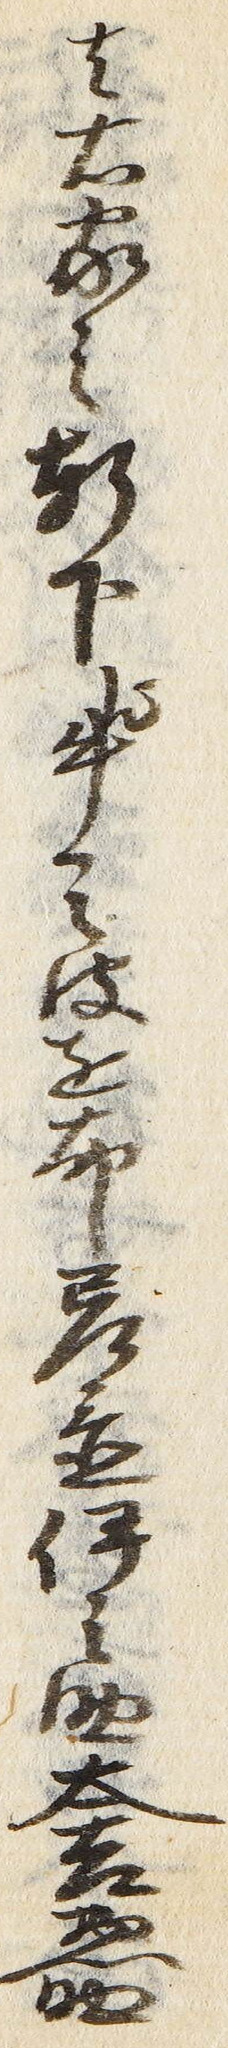者右家之軒下江牛之皮を布差置伊之助太吉惣助
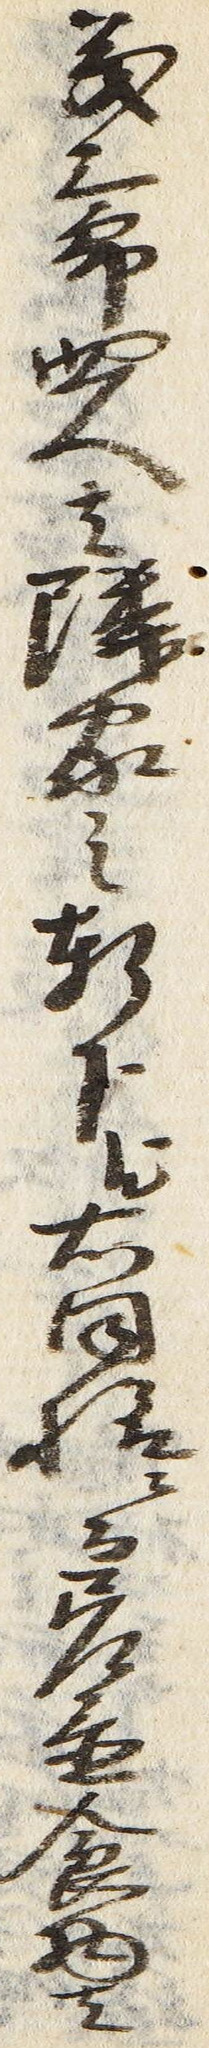茂三郎四人者隣家之軒下江右同様ニ而差置食物者
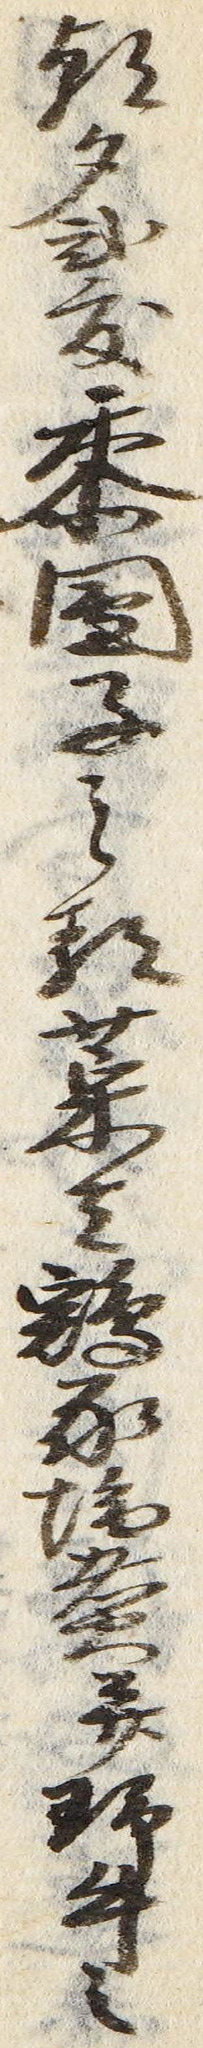朝夕弐度黍團子之類菜者鶏豕塩煑幷野牛之
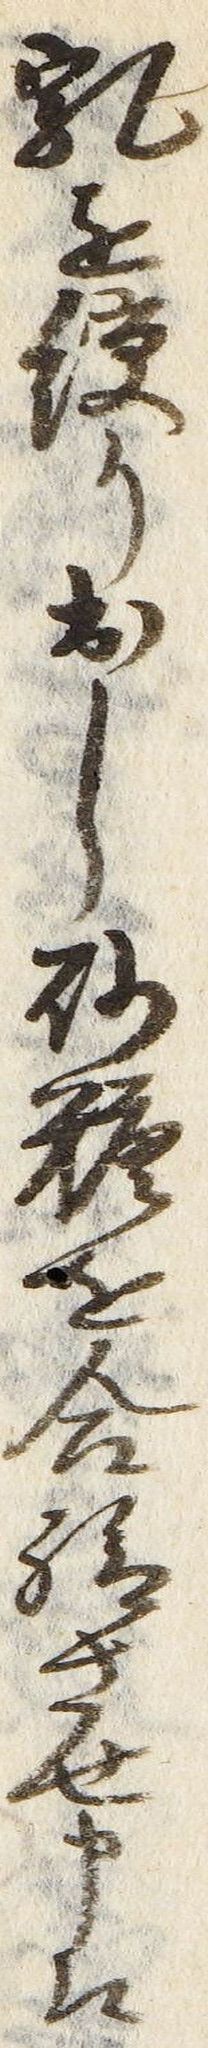乳を絞り出し砂糖を合給させ申候
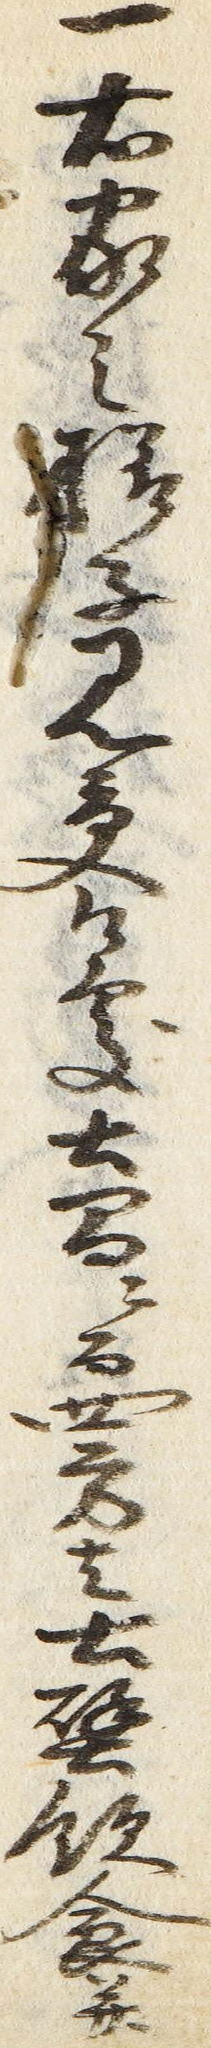一右家之様子見受候處土間ニ而四方者土壁飲食幷
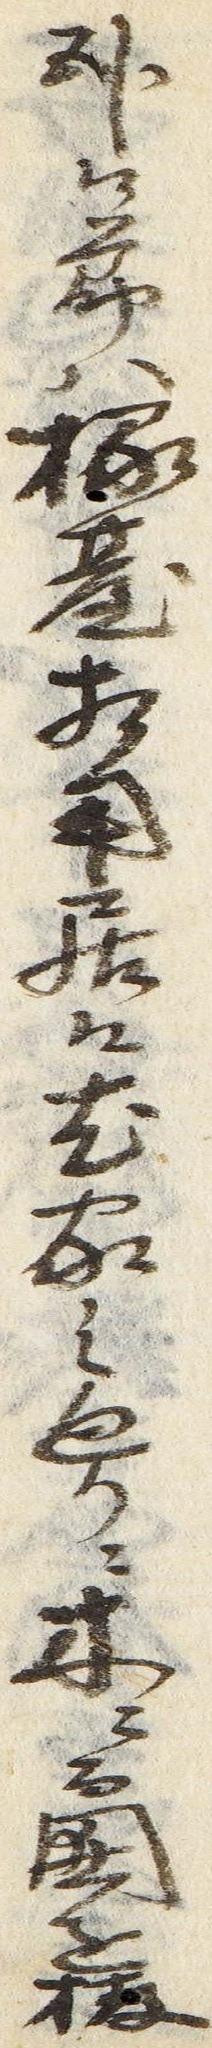臥候節ハ縁臺相用居候尤家之廻りニ木ニ而囲を拵

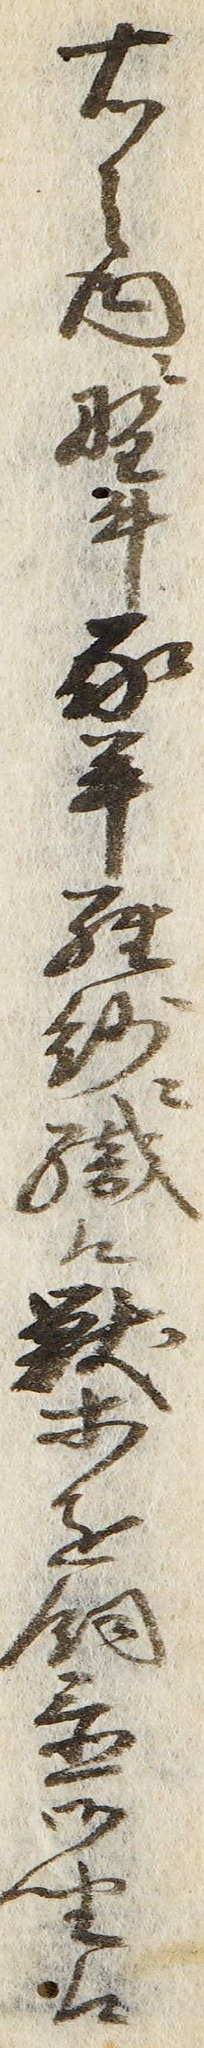右之内ニ野牛豕羊羅紗ニ織候獣等を飼置御座候
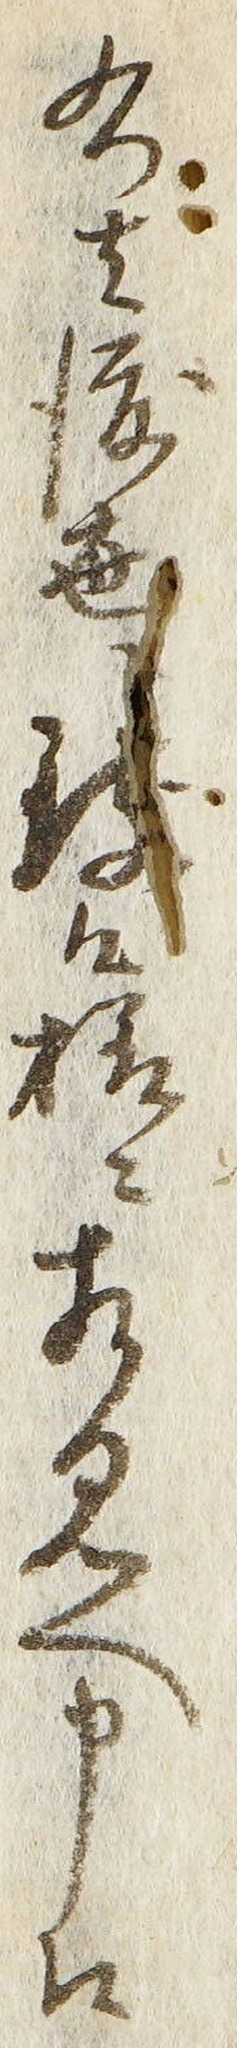右者渡世ニ致候様ニ相見へ申候
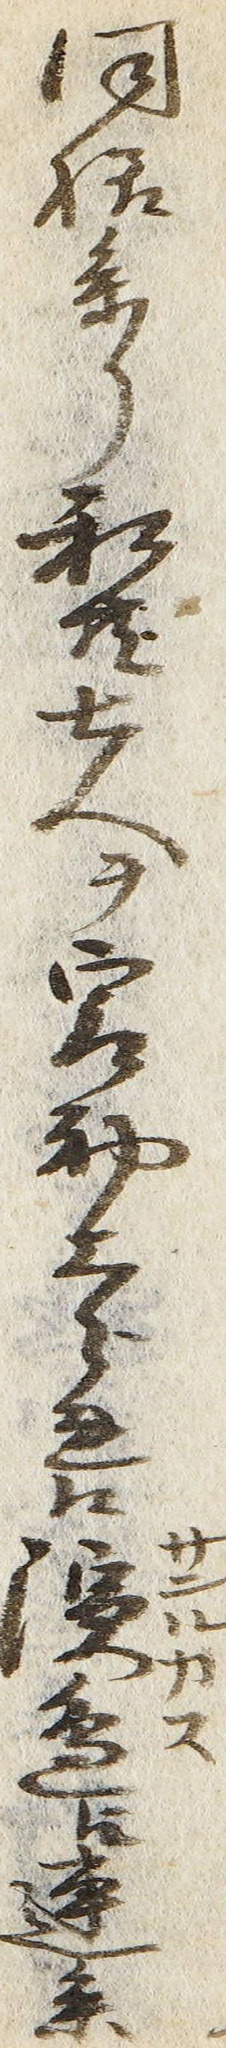同様参り私共七人ヲ最初上られ候濱邊江連参
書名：漂流人善助聞書
